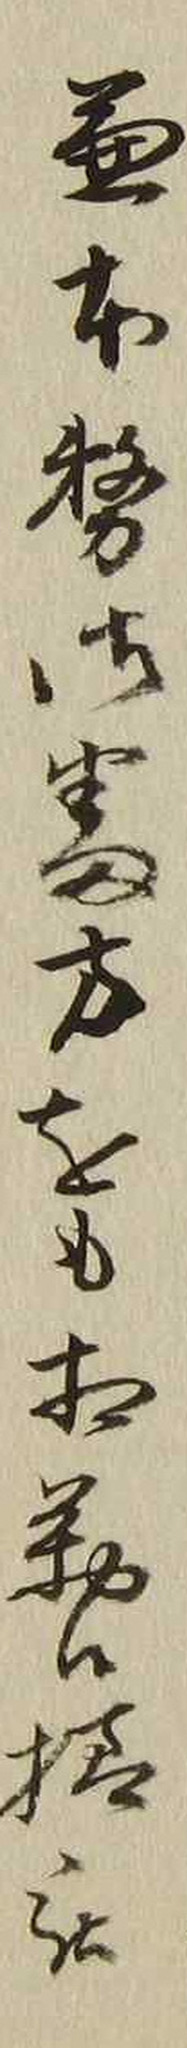兼本務御番方をも相勤候様被
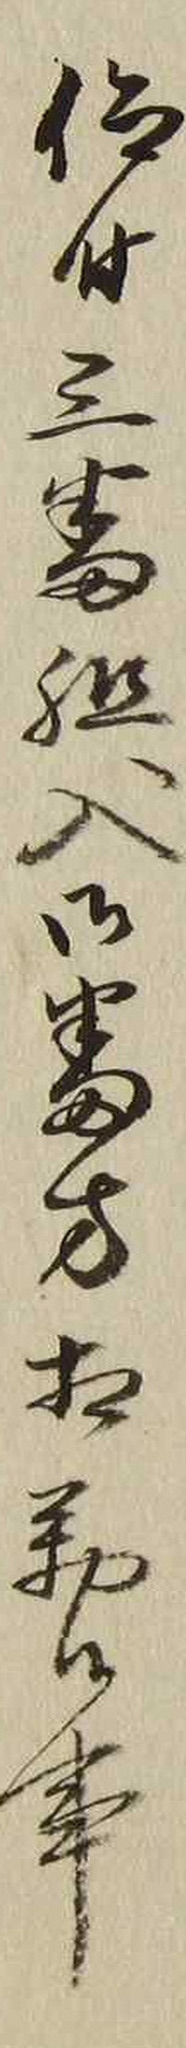仰付三番組へ入御番方相勤候事
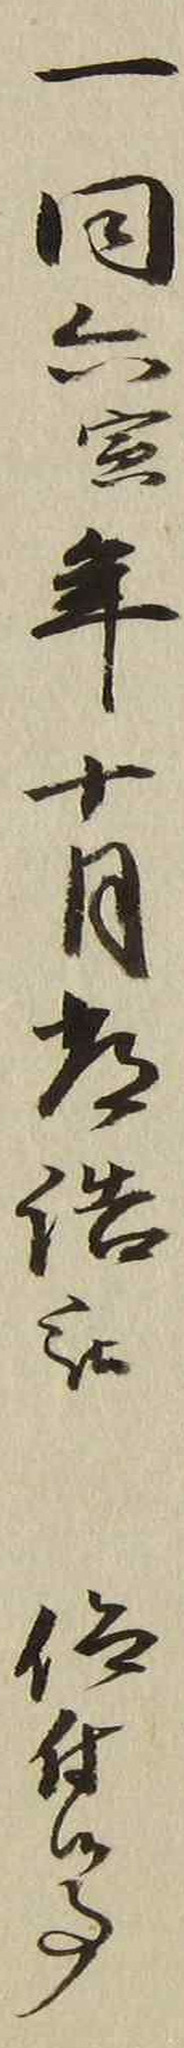一同六寅年十月常詰被仰付候事
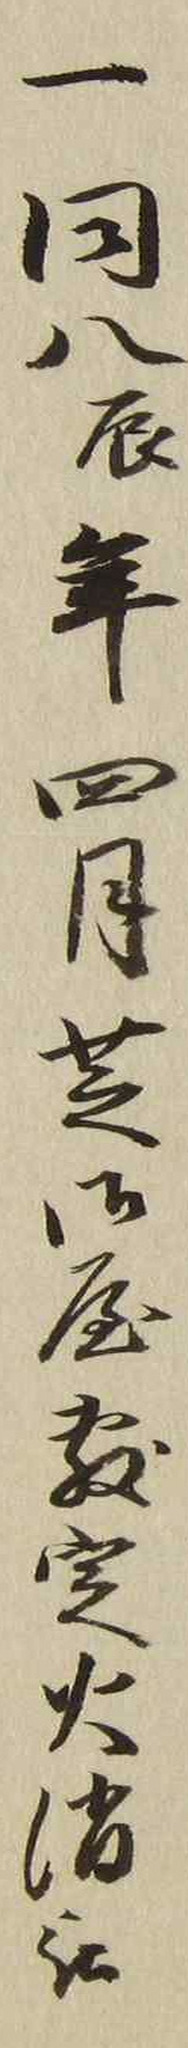一同八辰年四月芝御屋敷定火消被

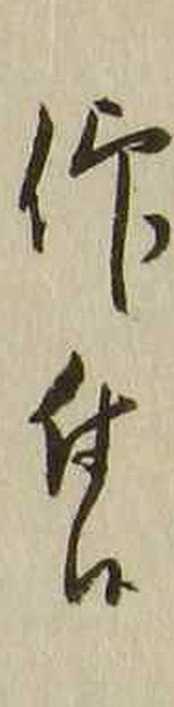仰付候
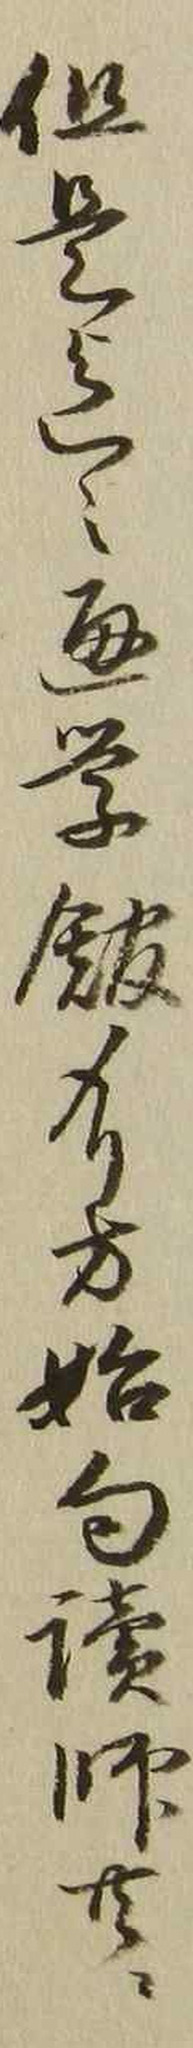但是迄之通学館〆り方始句読師共ニ
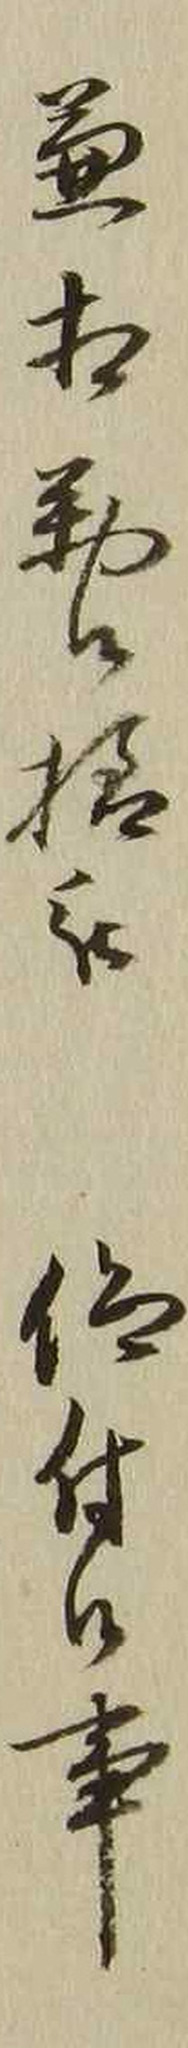兼相勤候様被仰付候事
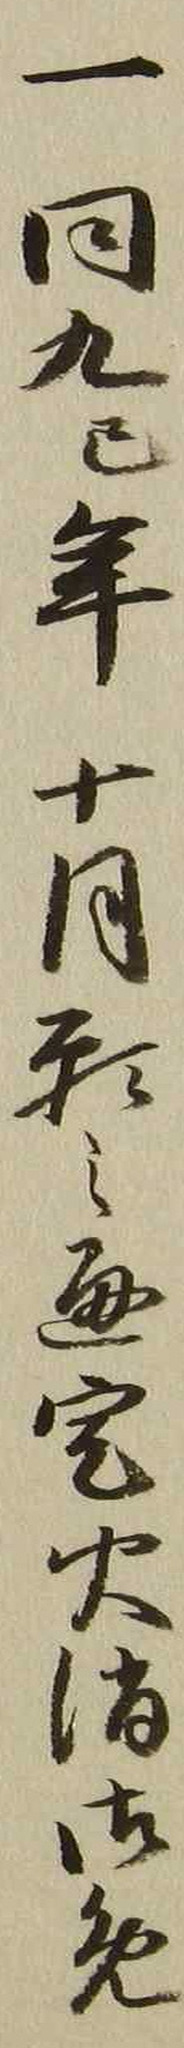一同九巳年十月願之通定火消御免
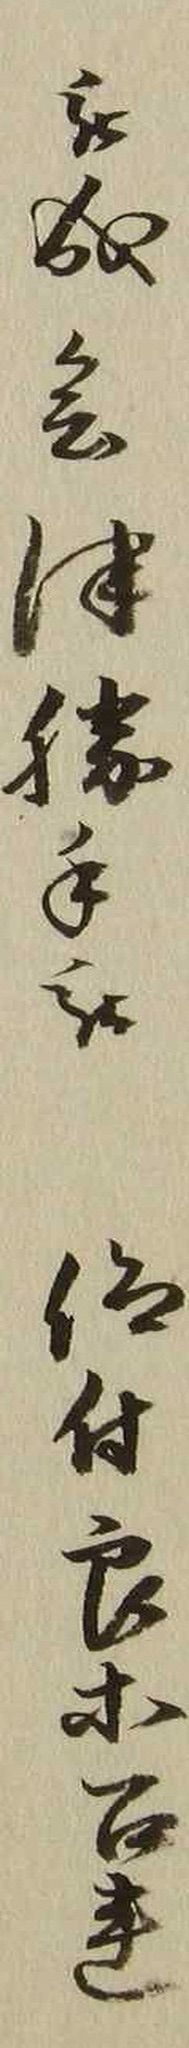被成会津勝手被仰付郎等召連
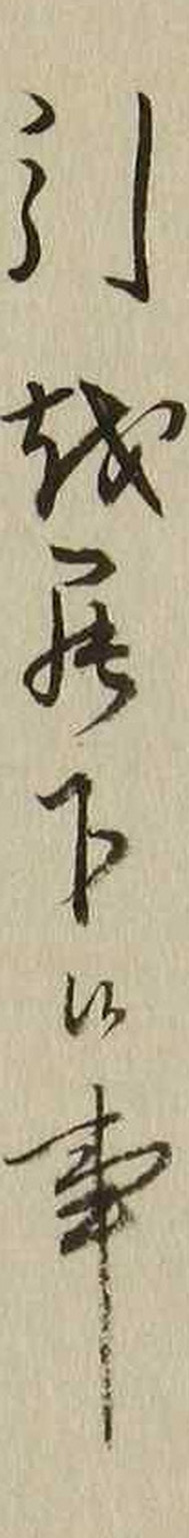引越罷下候事
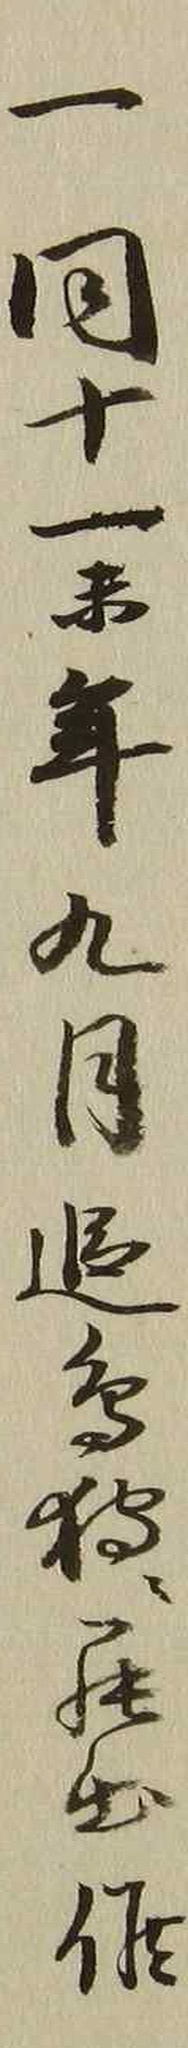一同十一未年九月追鳥狩ニ罷出候
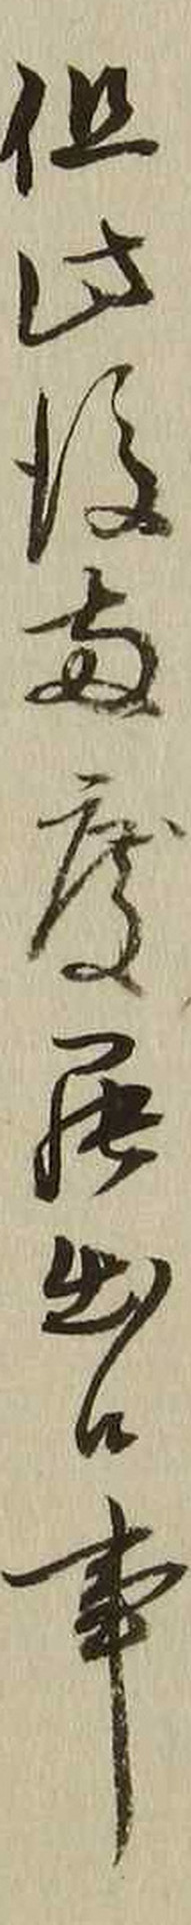但此後両度罷出候事
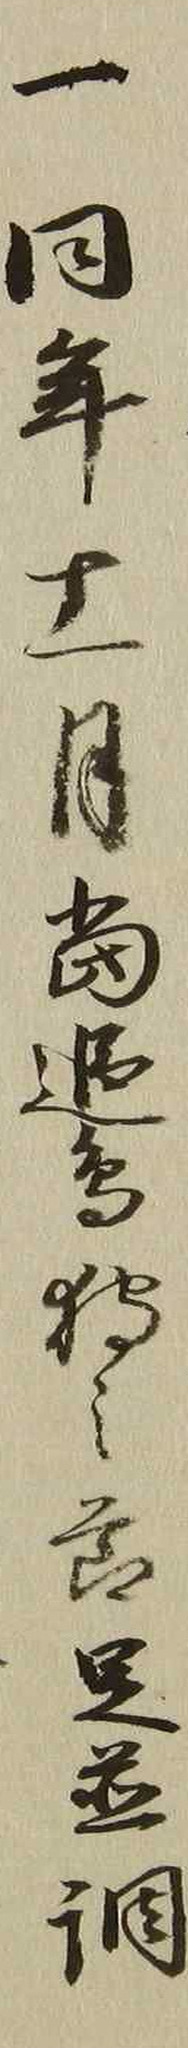一同年十一月当追鳥狩之節足並調
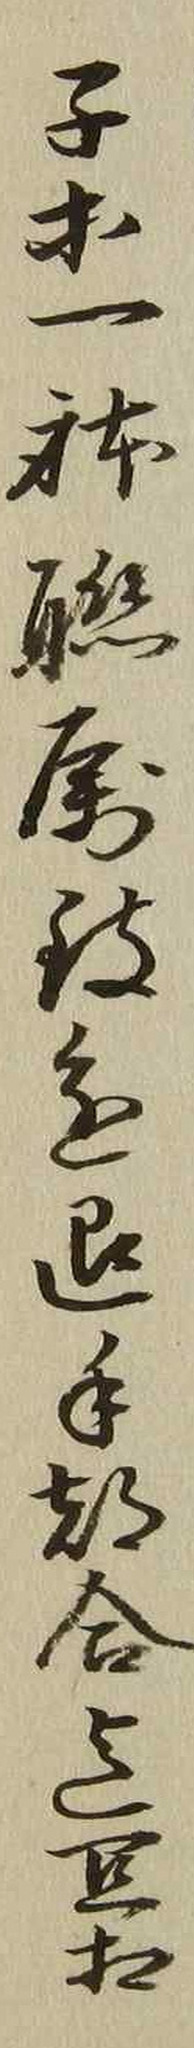子等一体聯属致進退手都合迄宜相
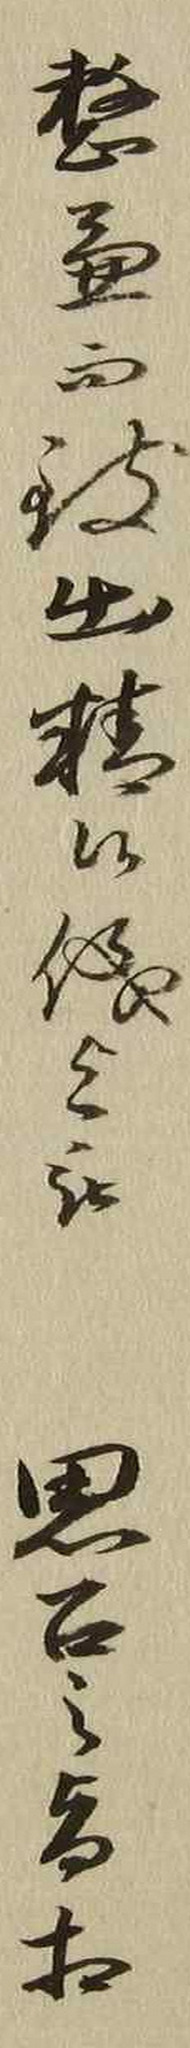整兼而致出精候儀与被思召之旨相
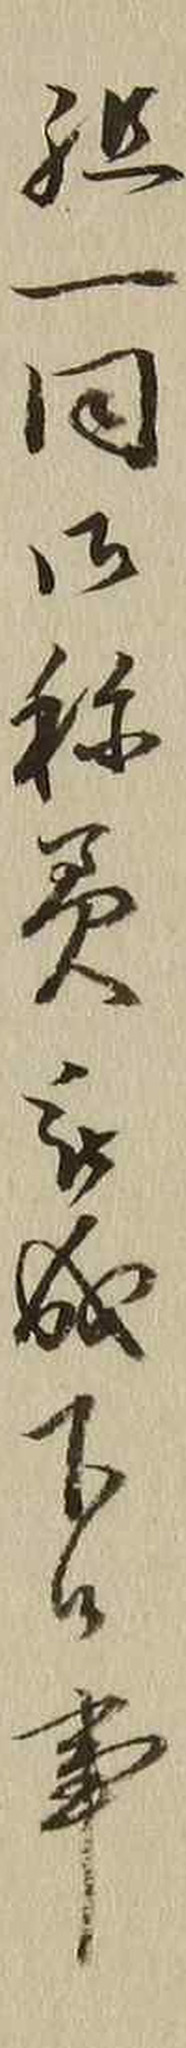組一同御称美被成下候事
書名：諸士系譜　巻之61　と之部4
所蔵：会津若松市立会津図書館
